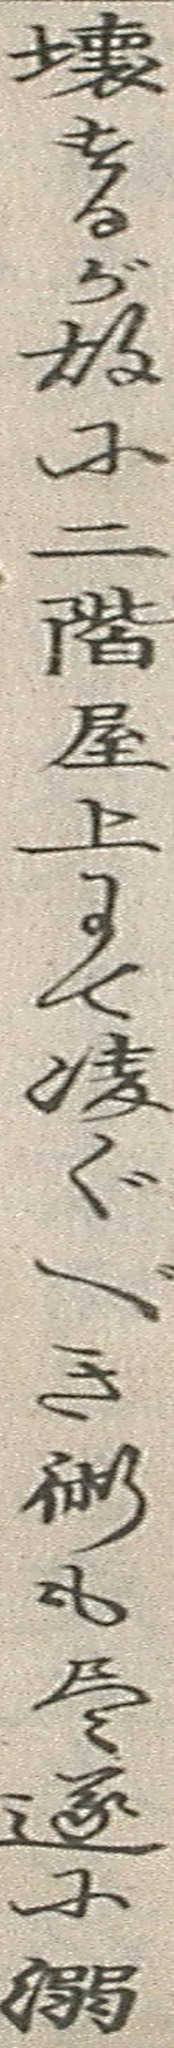壊するが故に二階屋上にて凌ぐべき術も尽遂に溺
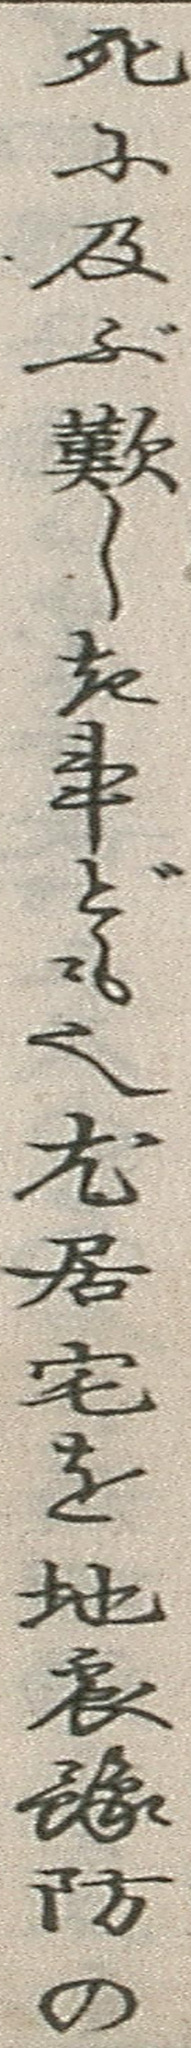死に及ぶ歎しき事ども也尤居宅を地震予防の
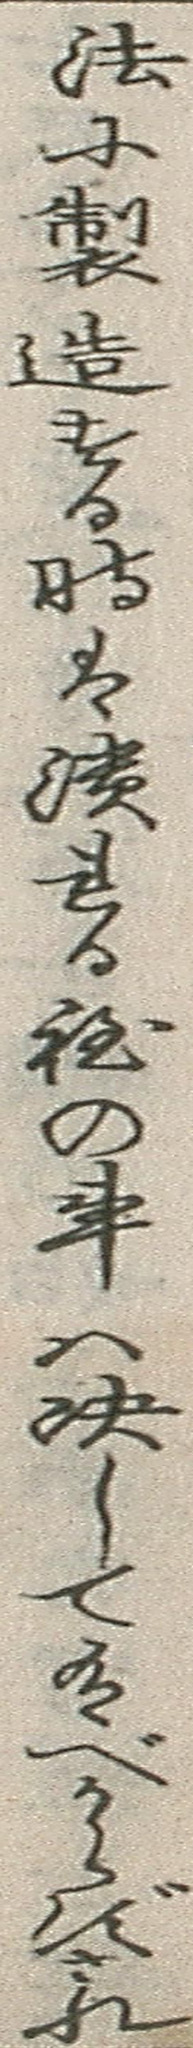法に製造する時は潰れる程の事は決して有べからずされ
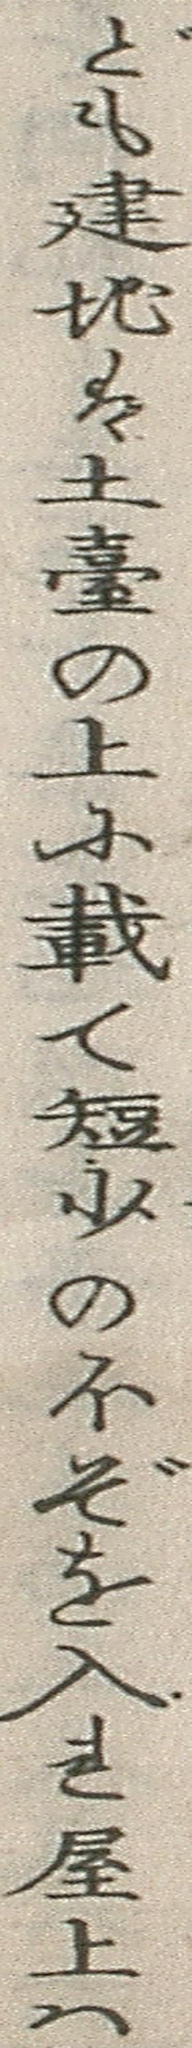ども建地は土臺の上に載て短小のほぞを入れ屋上は
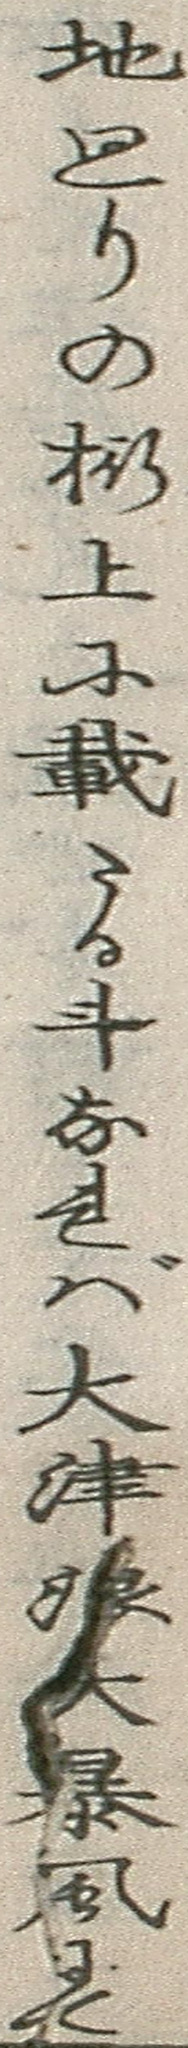地廻りの桁上に載たる斗なれば大津浪大暴風にて
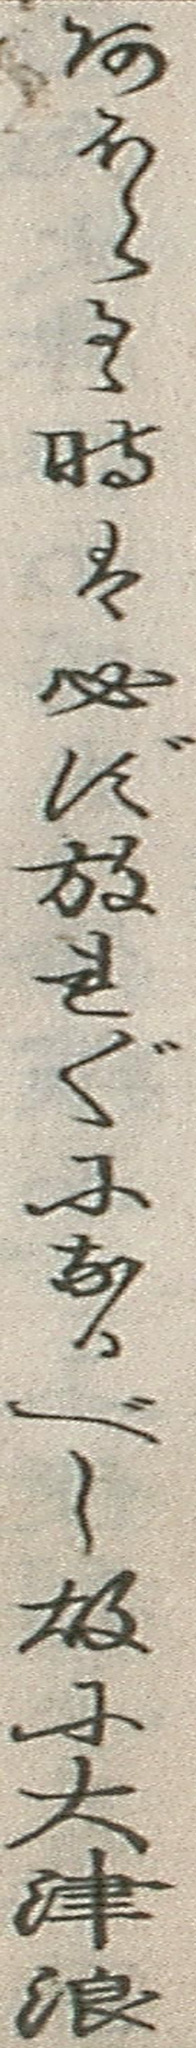あほらるゝ時は必ず放れ〴〵になるべし故に大津浪
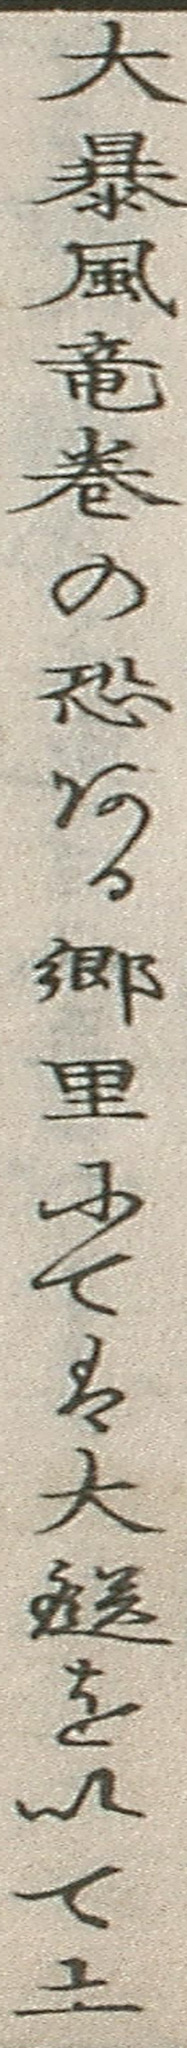大暴風竜巻の恐ある郷里にては大鎹を以て土
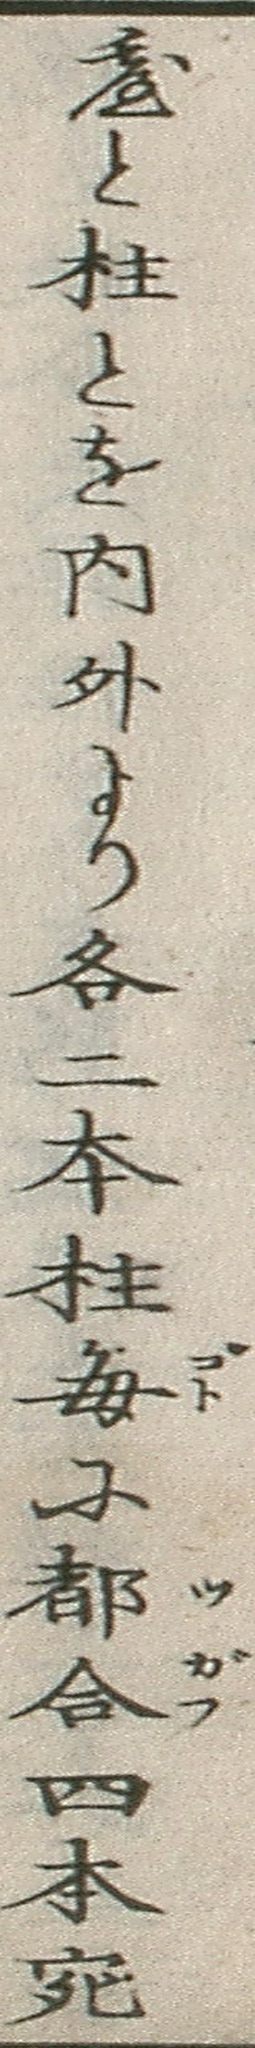臺と柱とを内外より各二本柱毎に都合四本宛
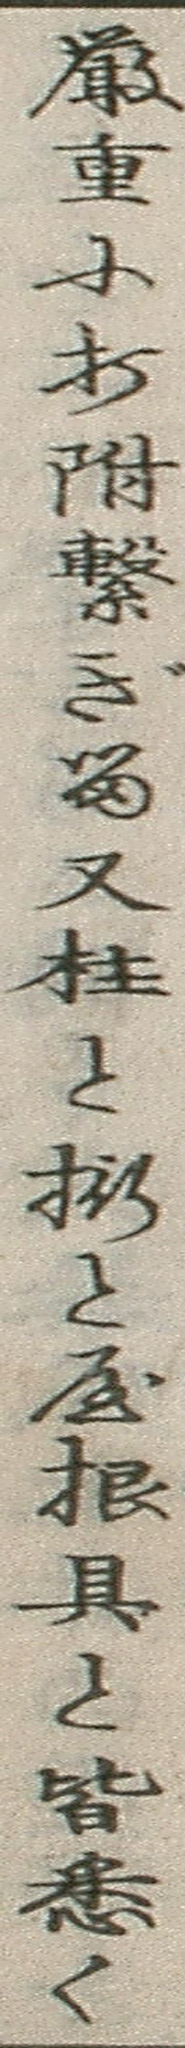厳重に打附繋ぎ留又柱と桁と家根具と皆悉く

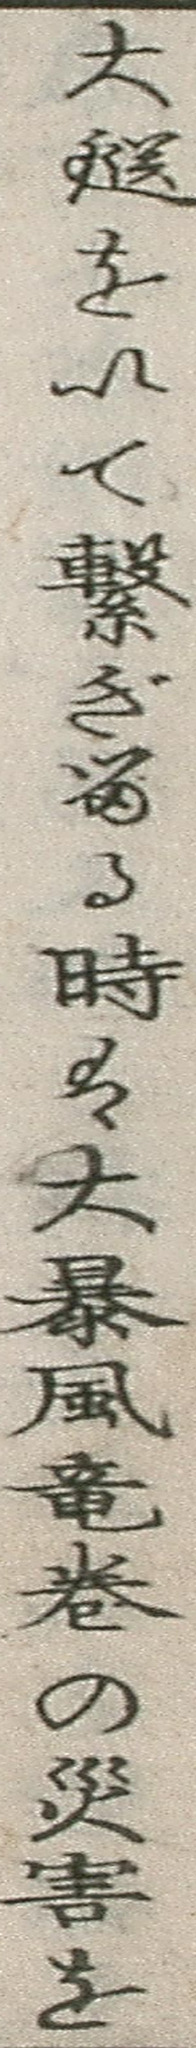大鎹を以て繋ぎ留る時は大暴風竜巻の災害を
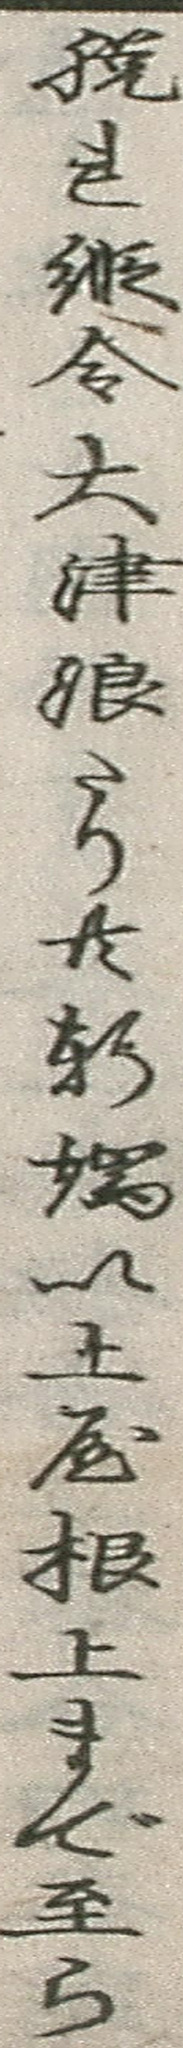脱れ縦令大津浪たり共軒端以上屋根上まで至ら
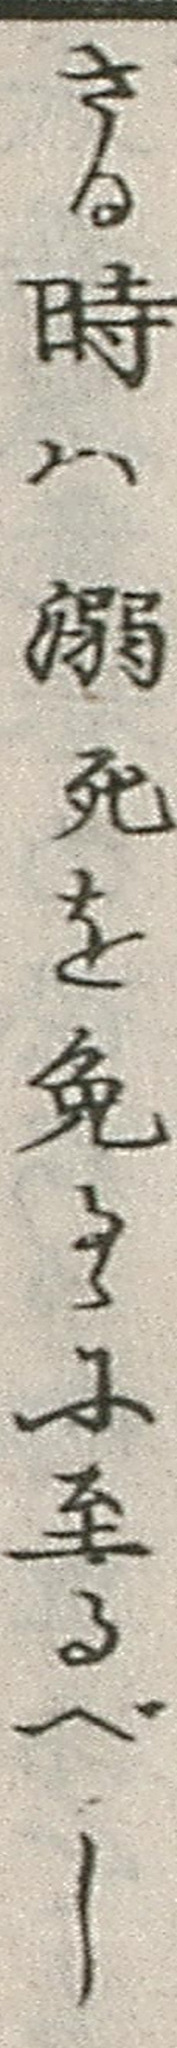ざる時は溺死を免るゝに至るべし
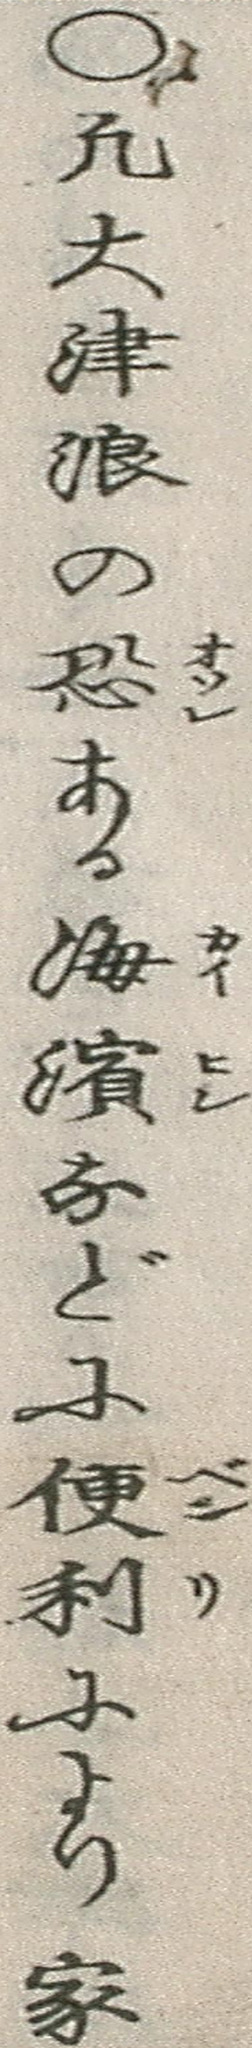〇凡大津浪の恐ある海浜などに便利により家
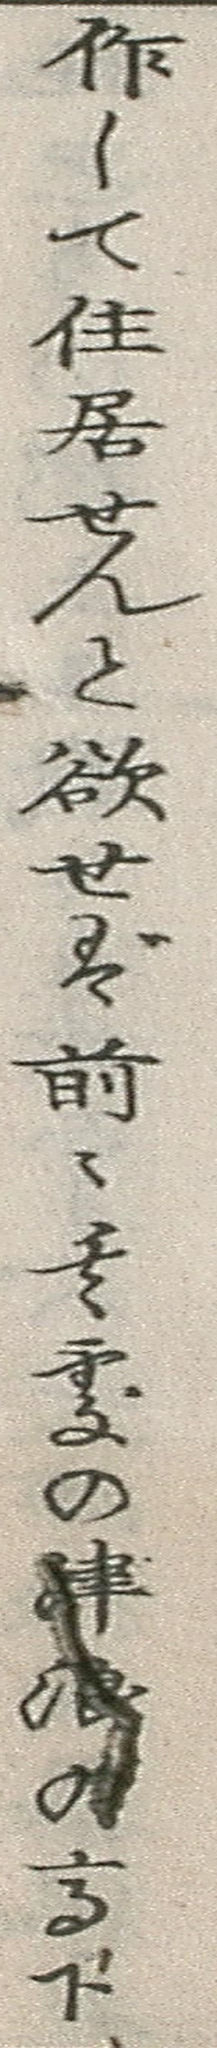作して住居せんと欲せば前〻其処の津波の高下
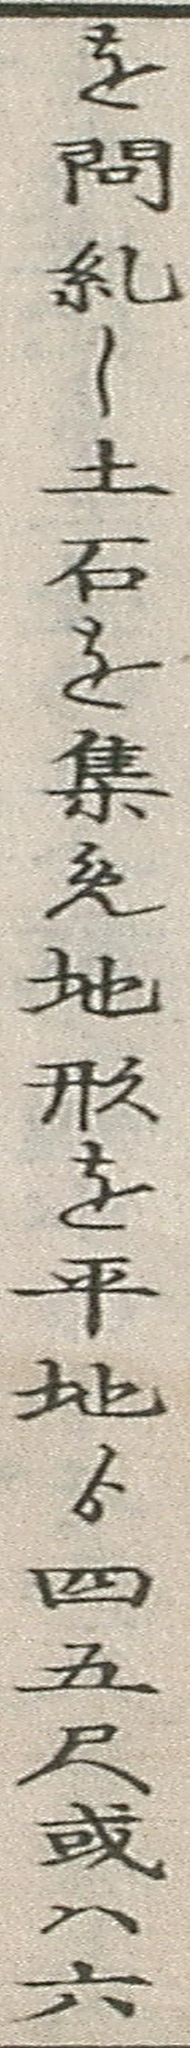を問糺し土石を集め地形を平地ゟ四五尺或は六
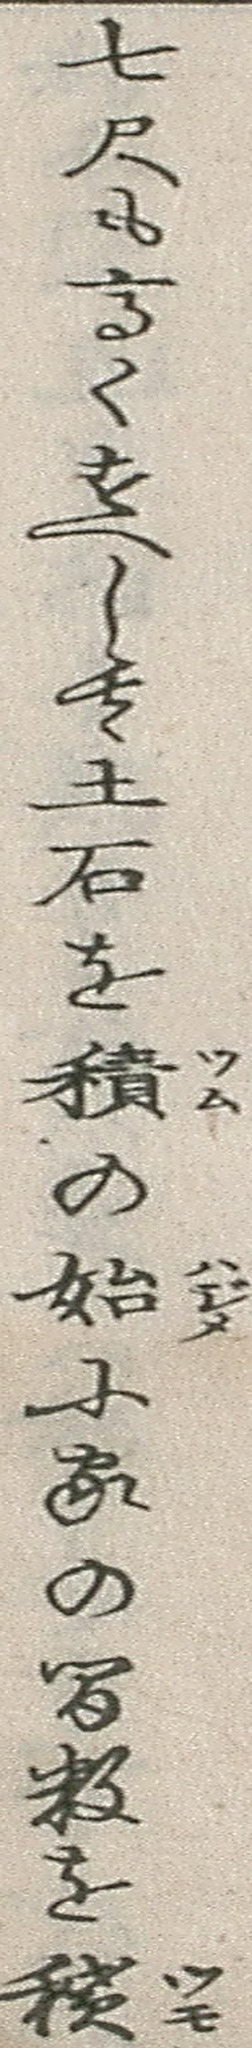七尺も高くすへし其土石を積の始に家の間数を積
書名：附録　地震劇風災害豫防法圖説（内題）
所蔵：東京大学地震研究所図書室 Earthquake Research Institute Library, The University of Tokyo, JAPAN
